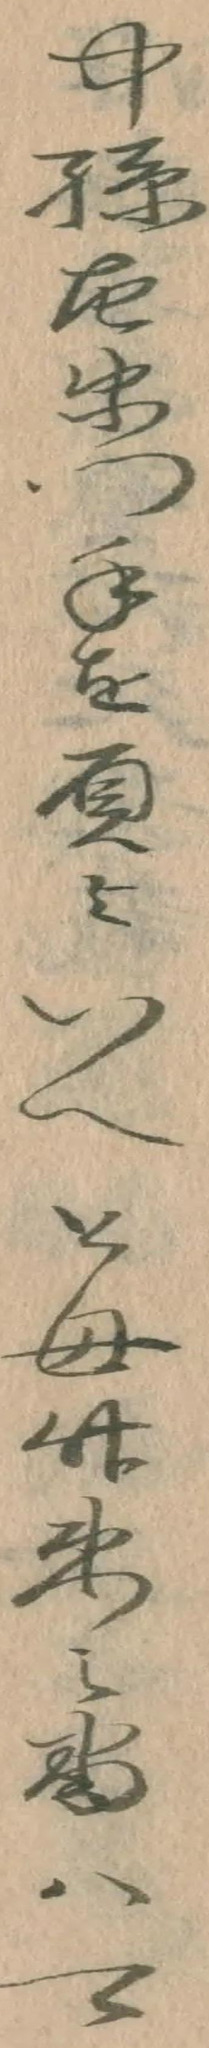中孫左衛門手を負与いへと母竹束之番は可
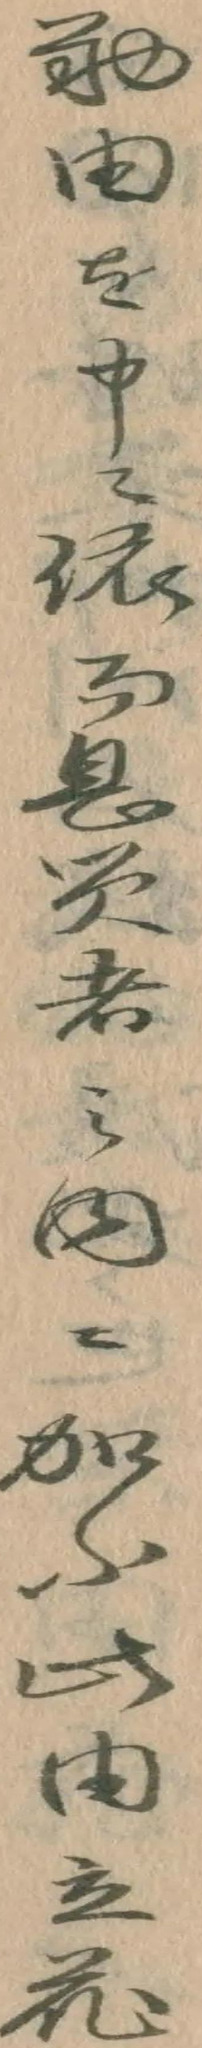勤由を申に依而息災者之内に加ふ此由立花
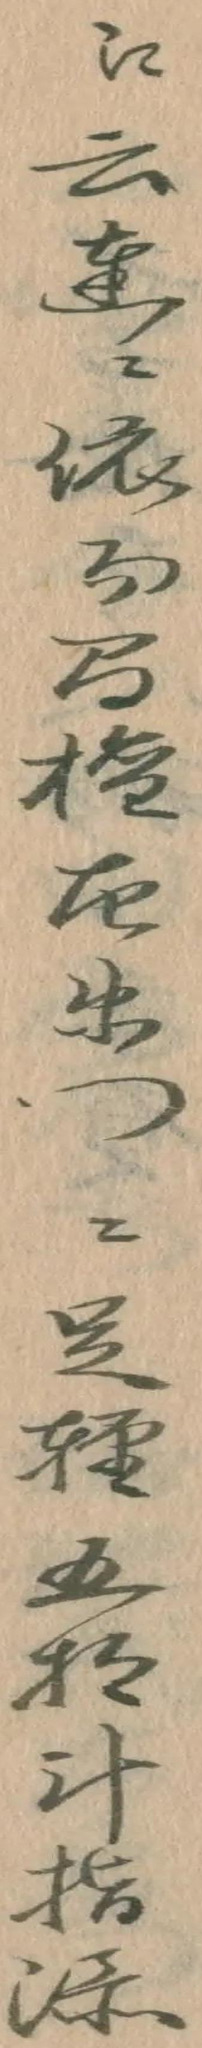江云達に依而間権左衛門に足軽五拾斗指添
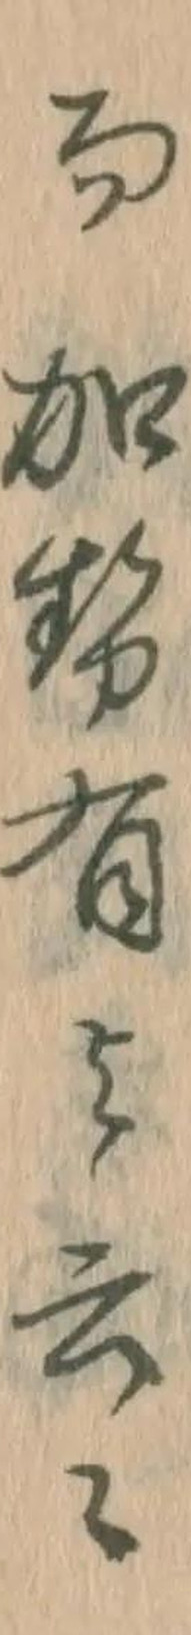而加勢有与云々
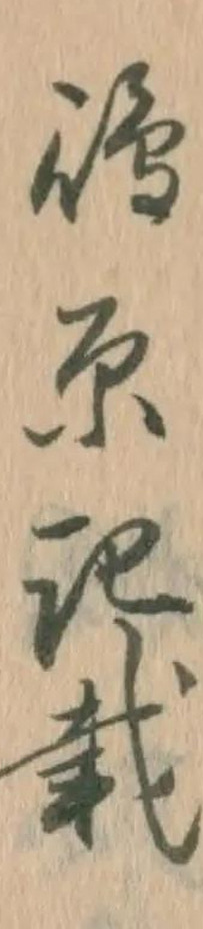島原記載
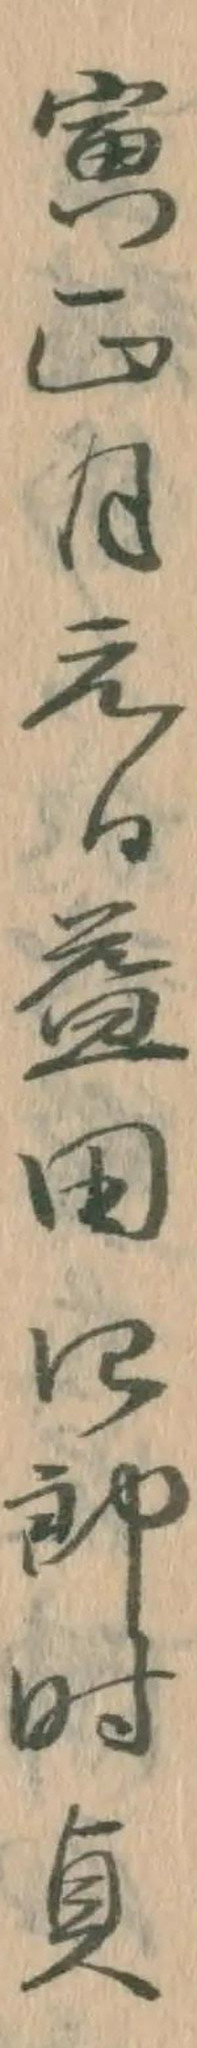寅正月元日益田四郎時貞
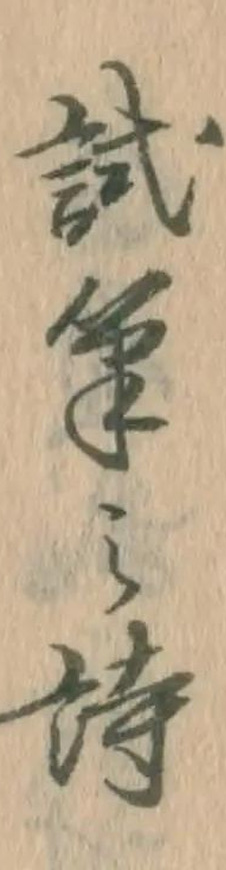試筆之詩
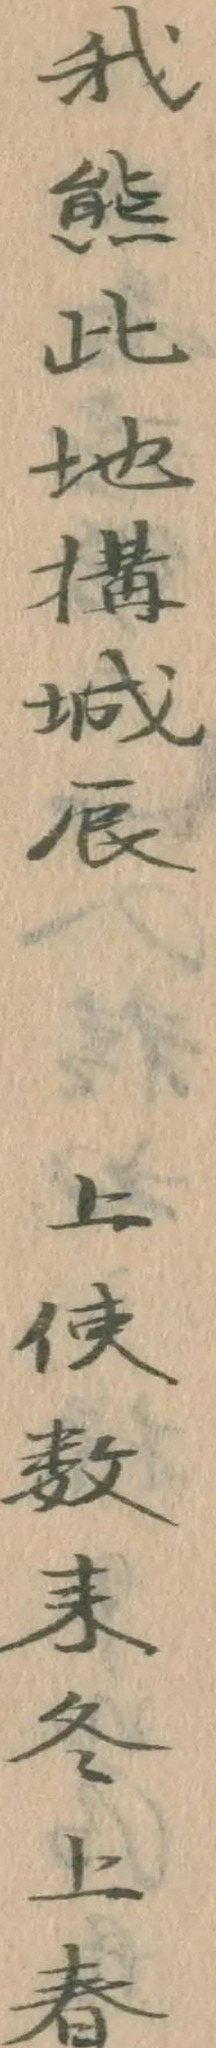我熊此地構城辰上使数来冬上春
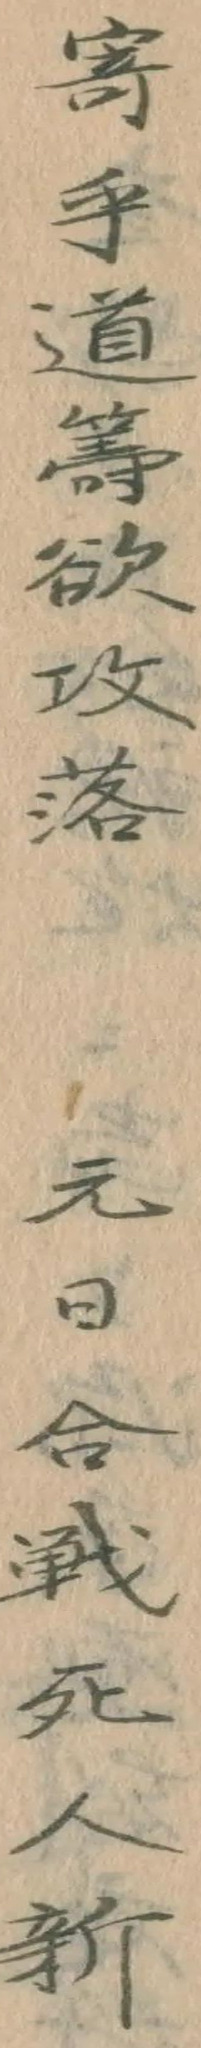寄手道等欲攻落元日合戦死人新
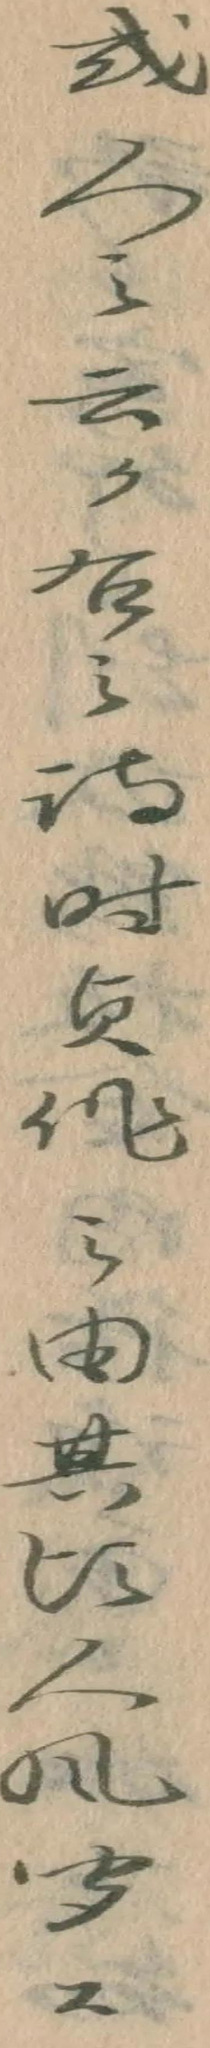或人之云く右之詩時貞作之由其頃人風聞す
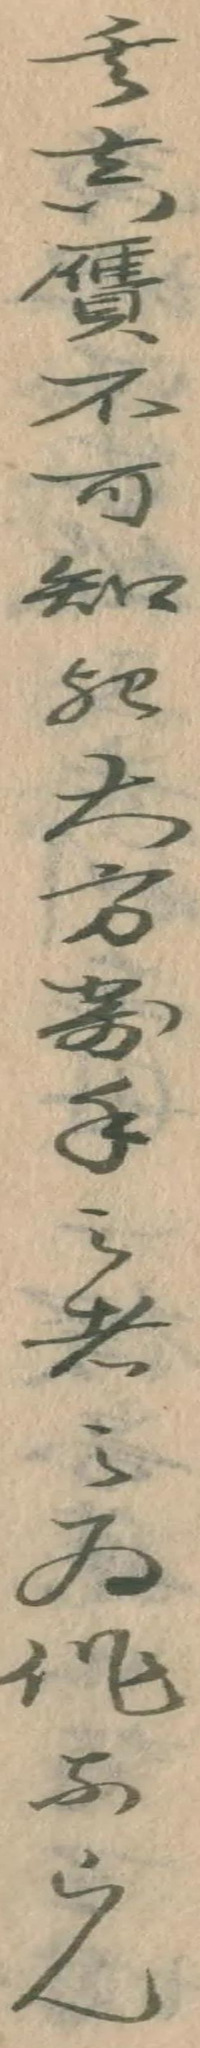其真贋不可知歟大方寄手之者之ゐ作ならん
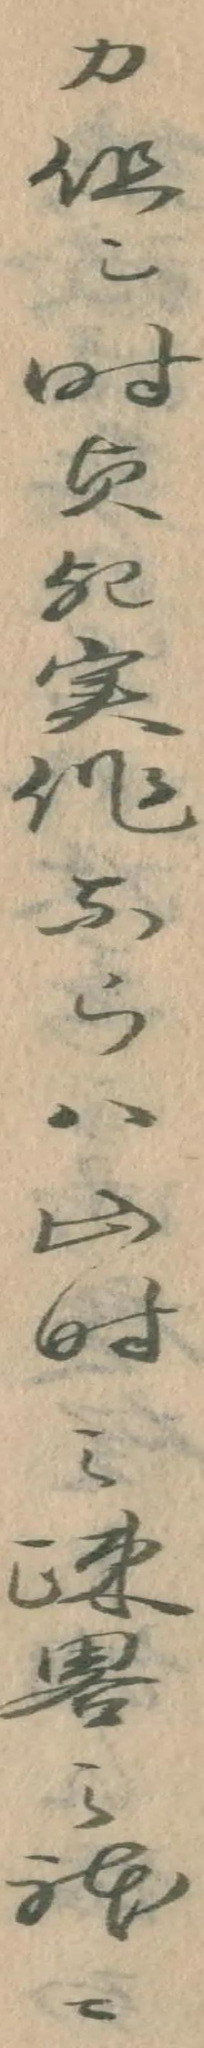か但し時貞歟実作ならは此時之疎略之躰に
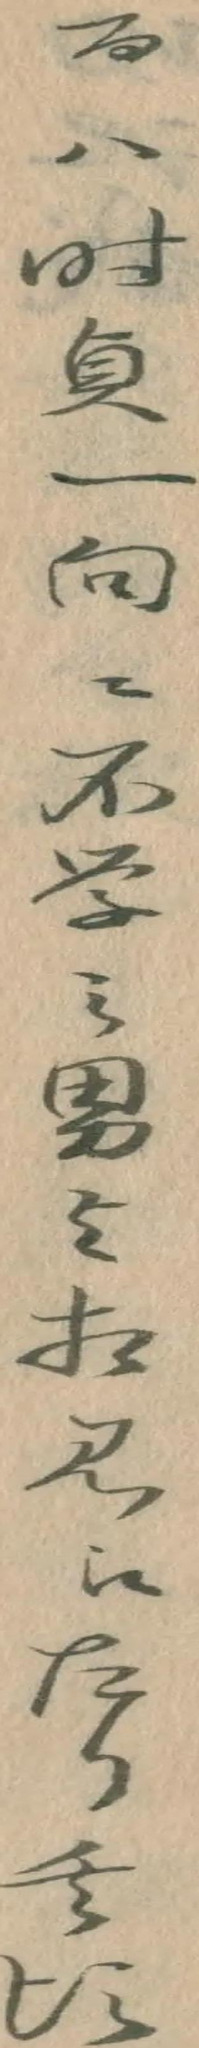而は時貞一向に不学之男与相見江たり其頃
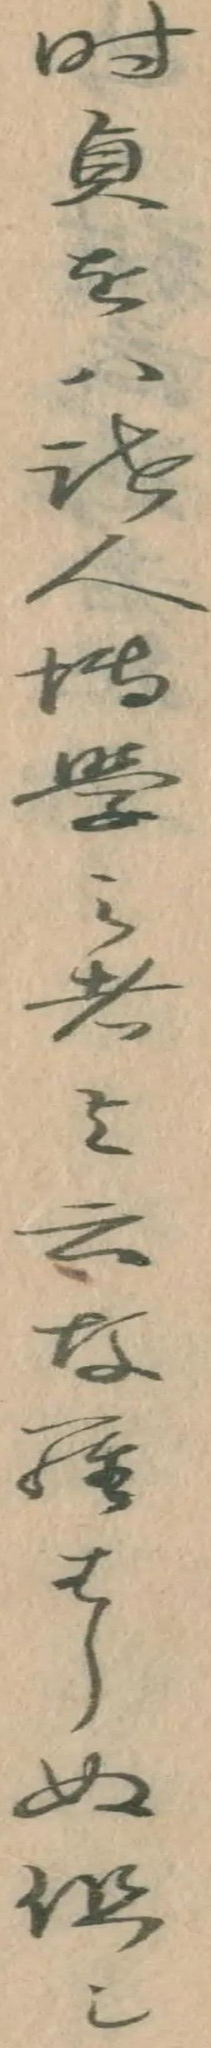時貞をは諸人博学之者与云な羅者しぬ但し
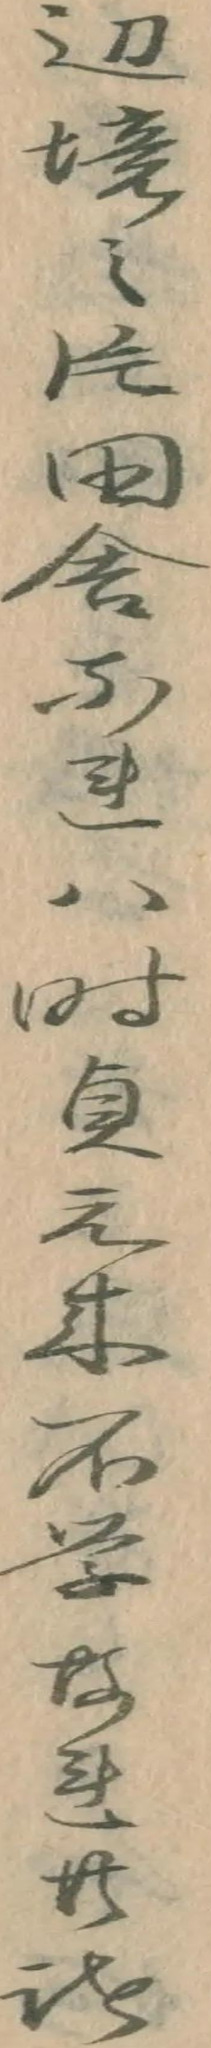辺境之片田舎な連は時貞元来不学な連共諸

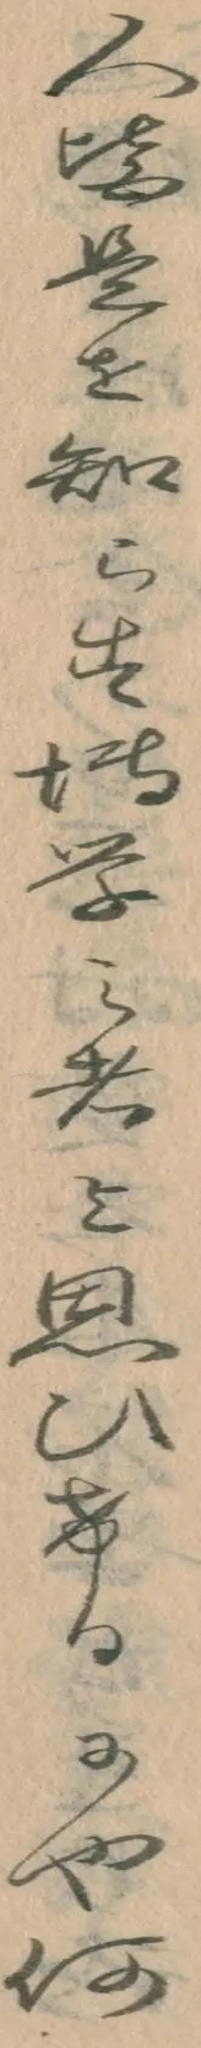人皆是を知ら春博学之者与思ひ希る尓や何
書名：切支丹御退治記 49巻. [5]
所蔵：国立国会図書館 National Diet Library, JAPAN
